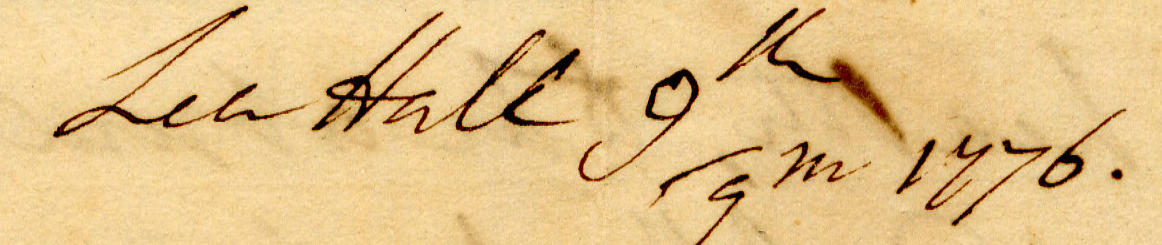Lea Hall 9^th/9^m 1776
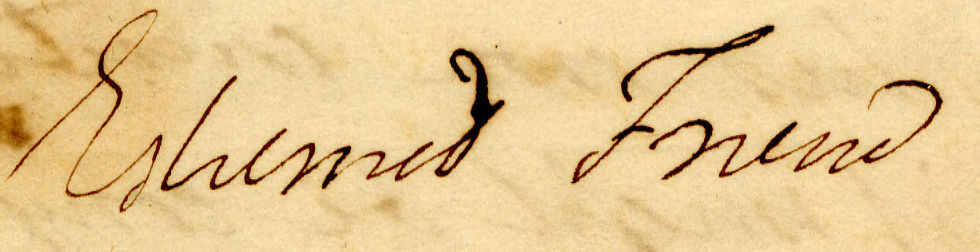Esteemed Friend
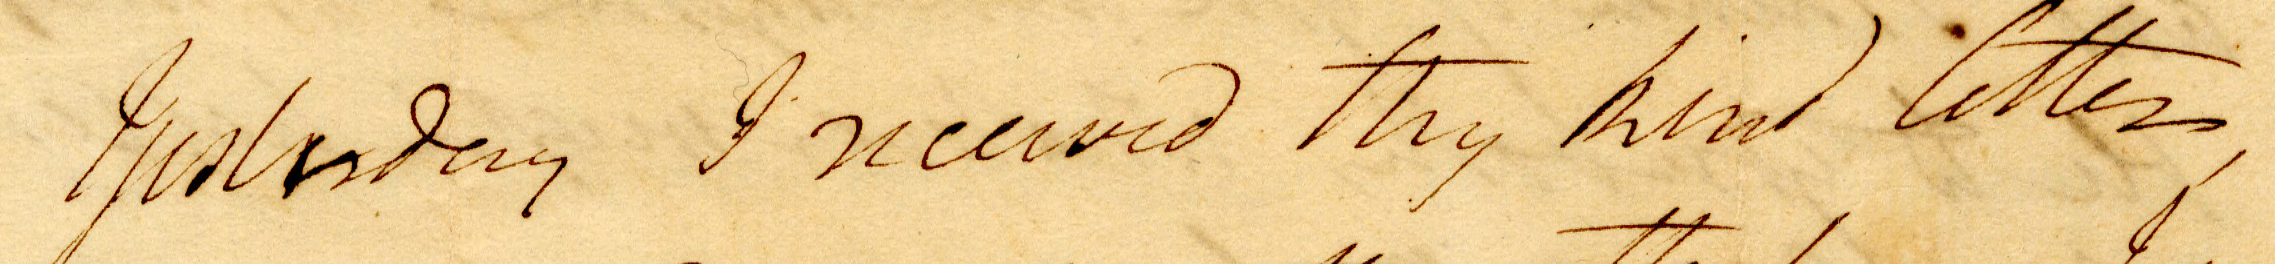Yesterday I received thy kind letter
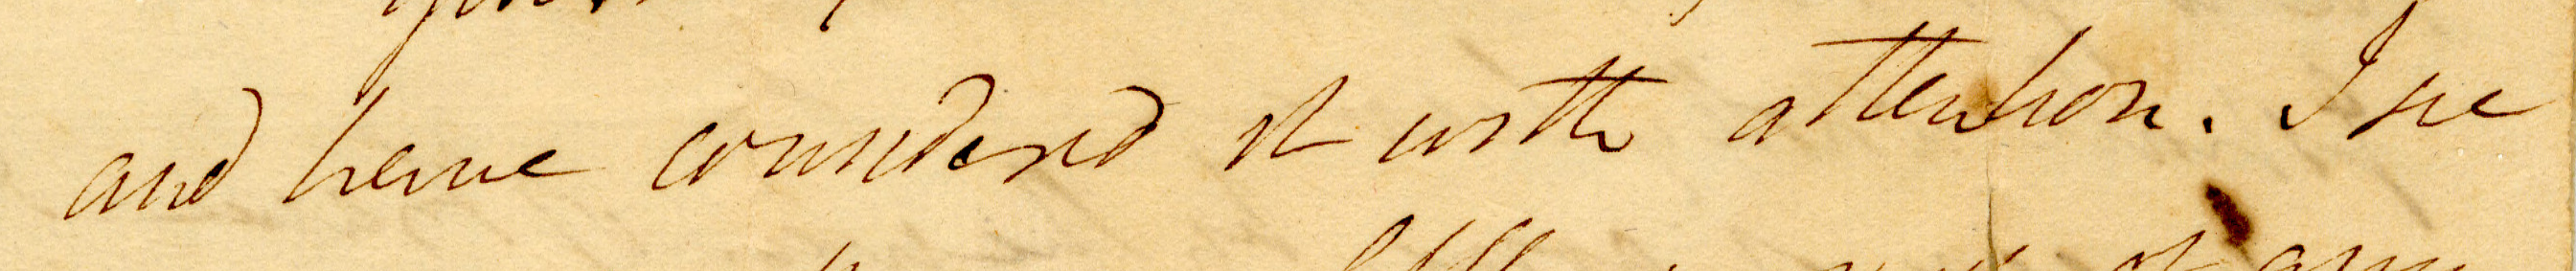and have considerd it with attention. I see
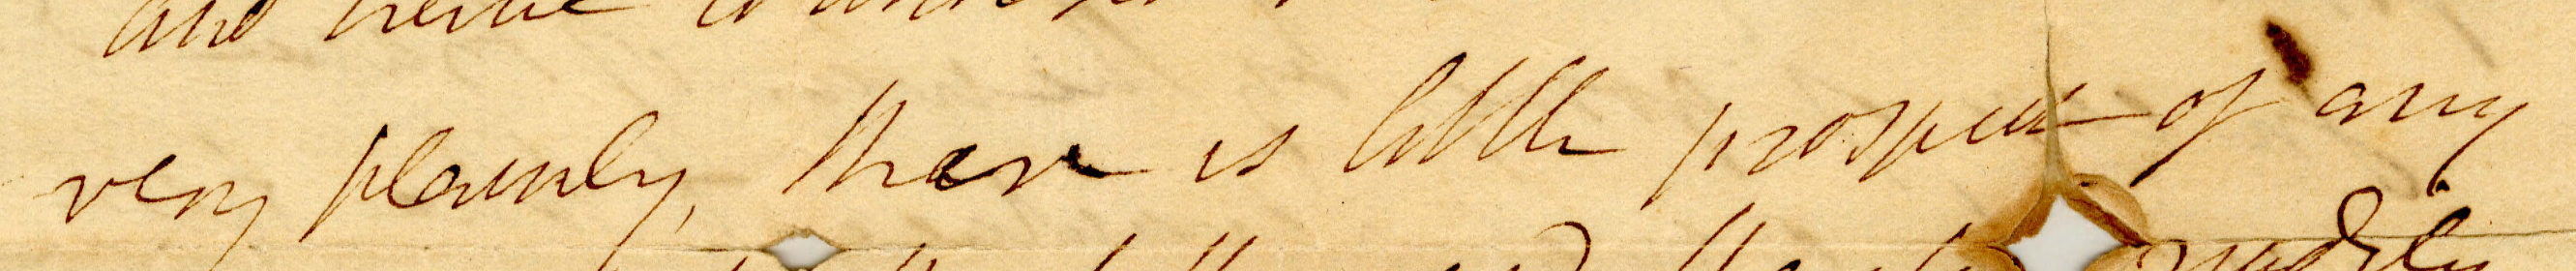very plainly, there is little prospect of any
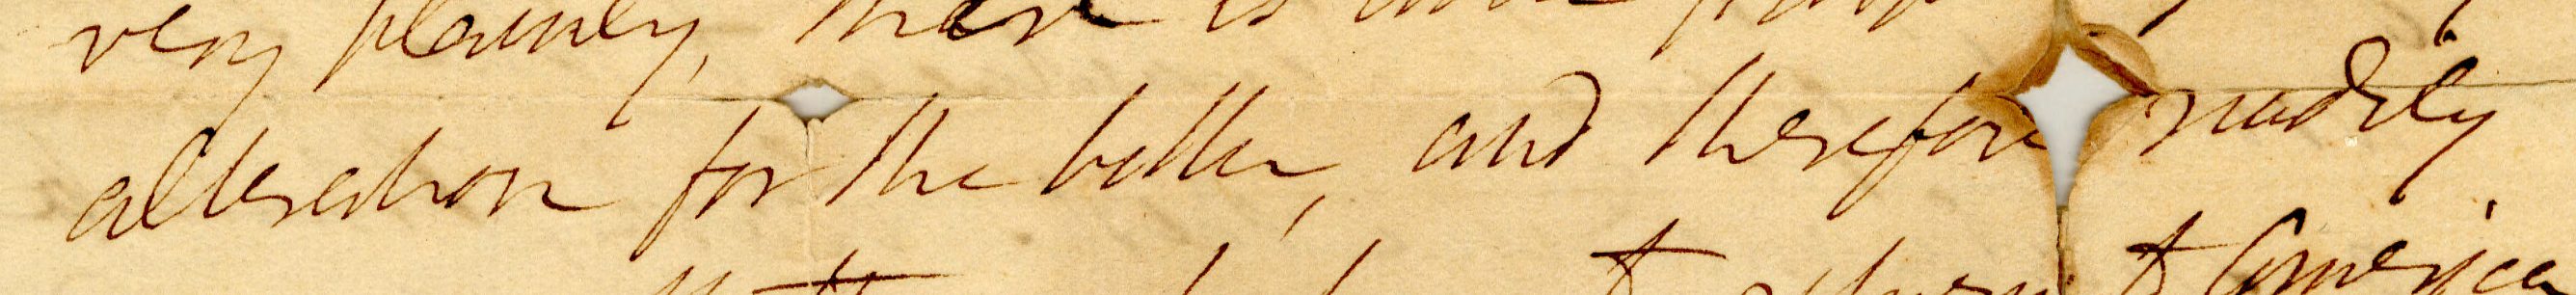alteration for the better and therefore hardly
